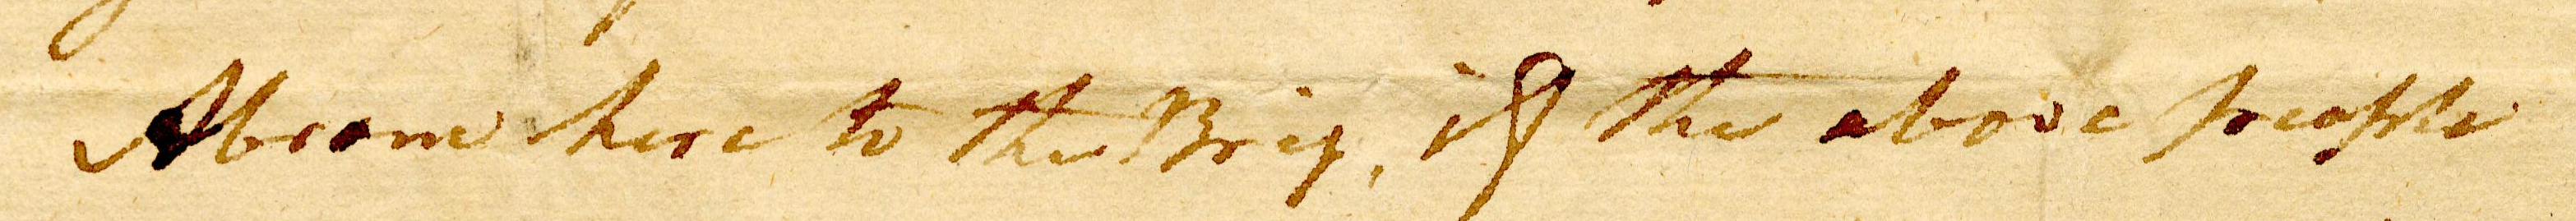Abram here to the Brig, if the above people
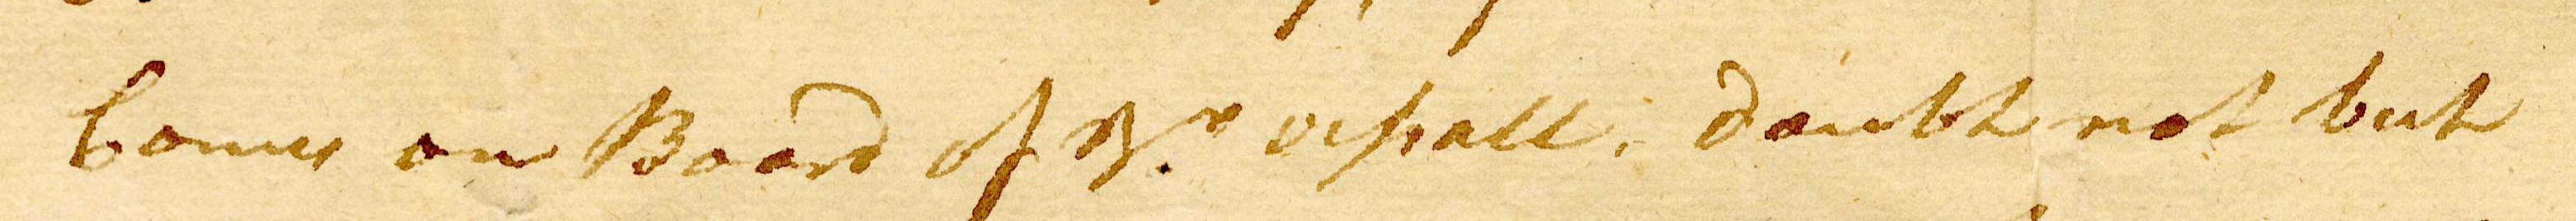Came on Board of y^e. Vessall. doubt not but
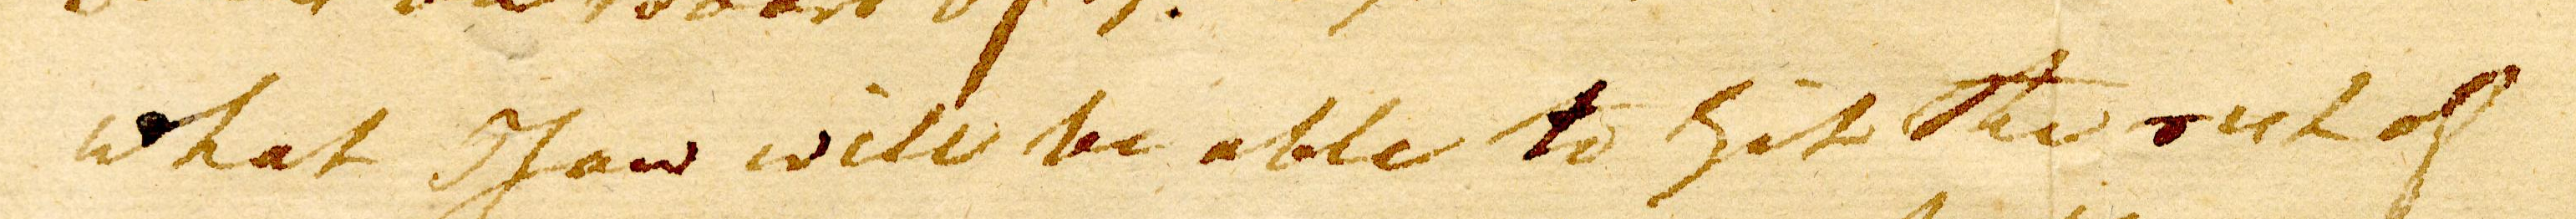what you will be able to Get the rest of
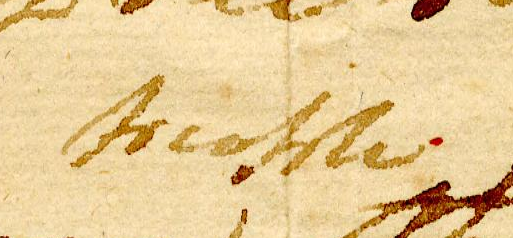people
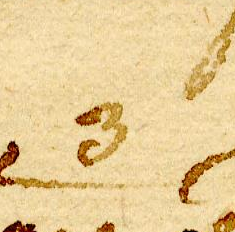3
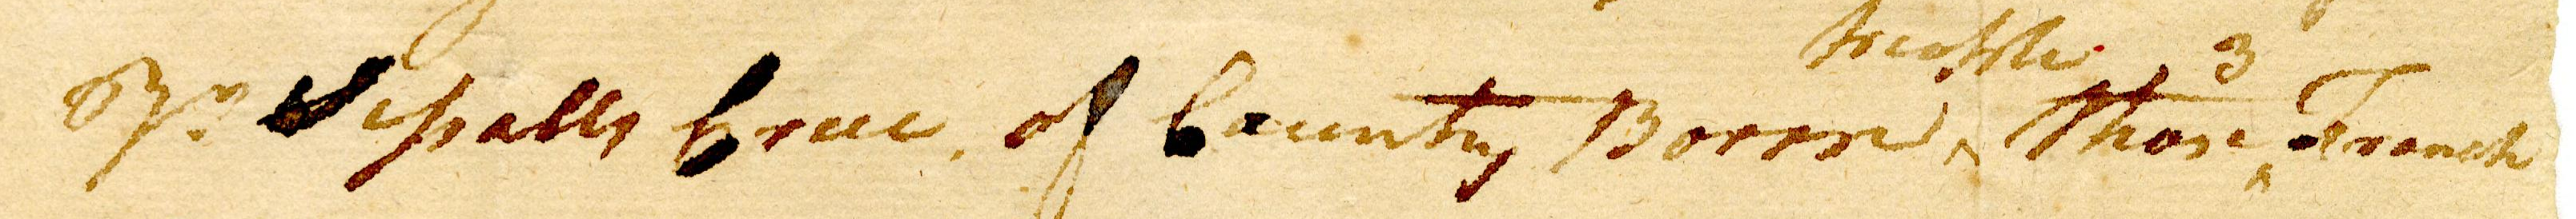y^r. vesalls Crue of Country Borrow ^ those ^ French
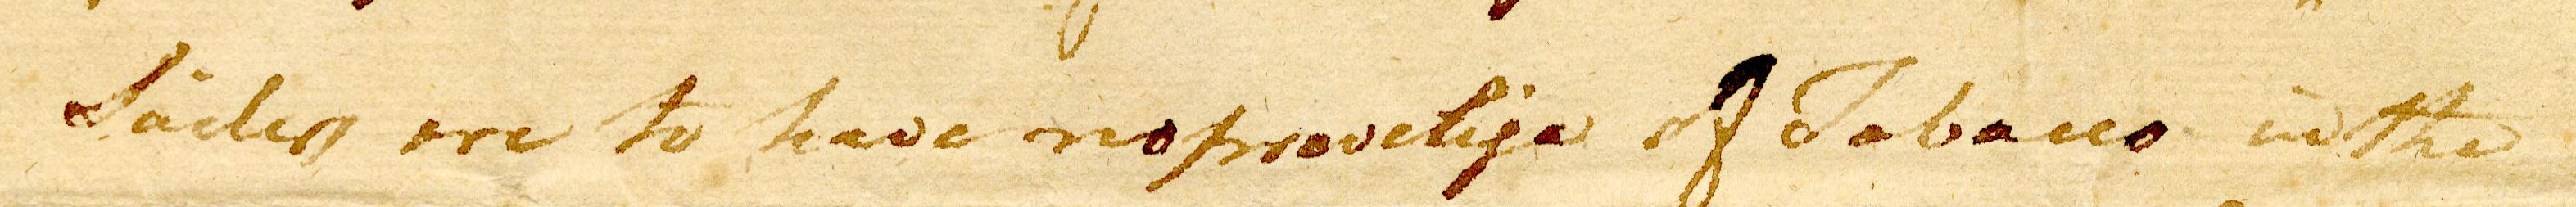Sailers are to have no prevelige of tobacco in the
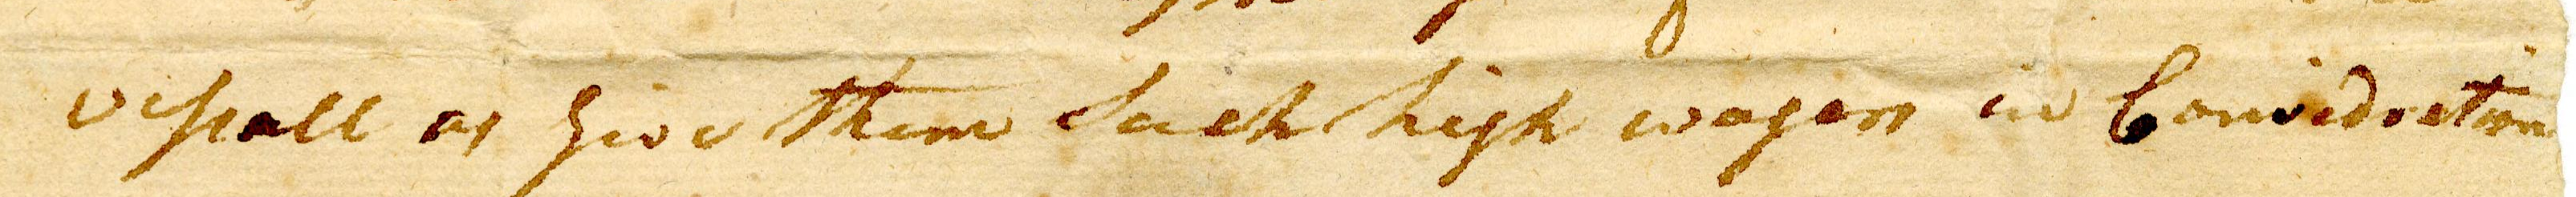vessal as Give them such high wager in consideration
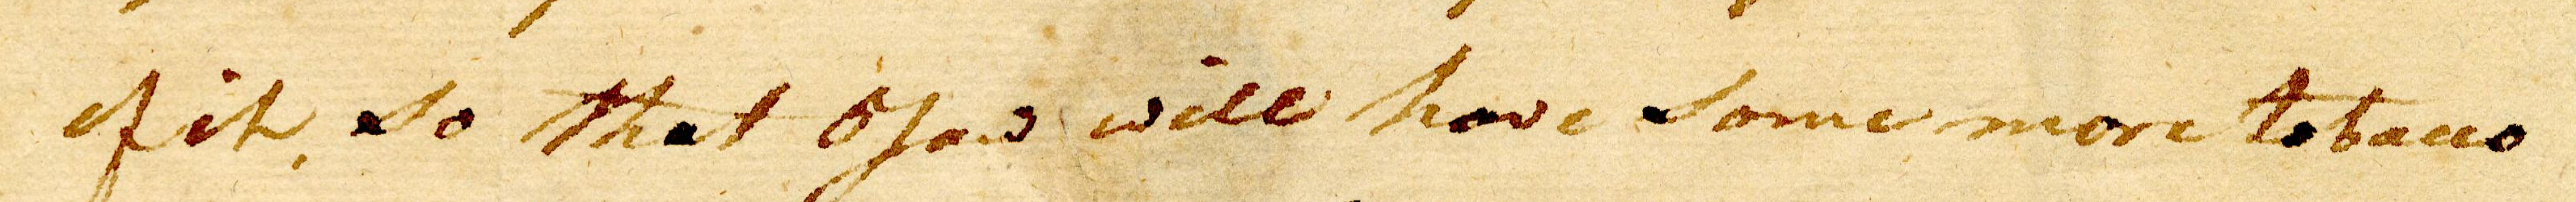of it so that you will have Some more tobacco
